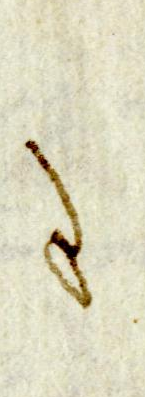a
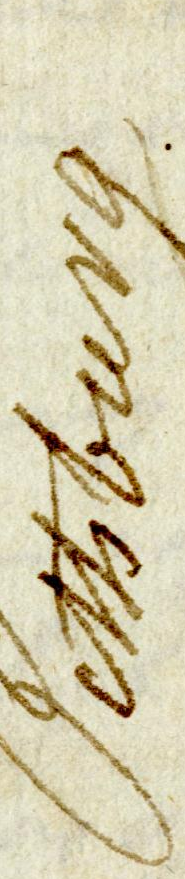Pittsburg
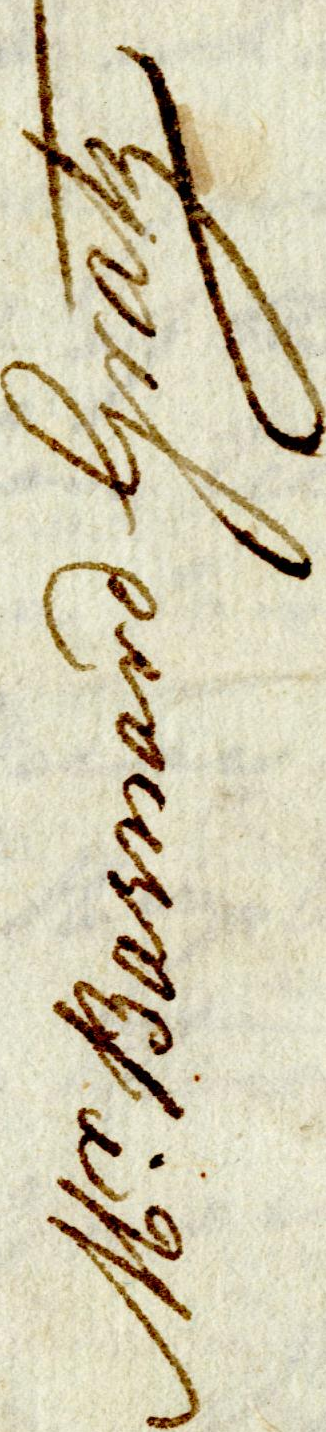M^r Barnard Gratz
